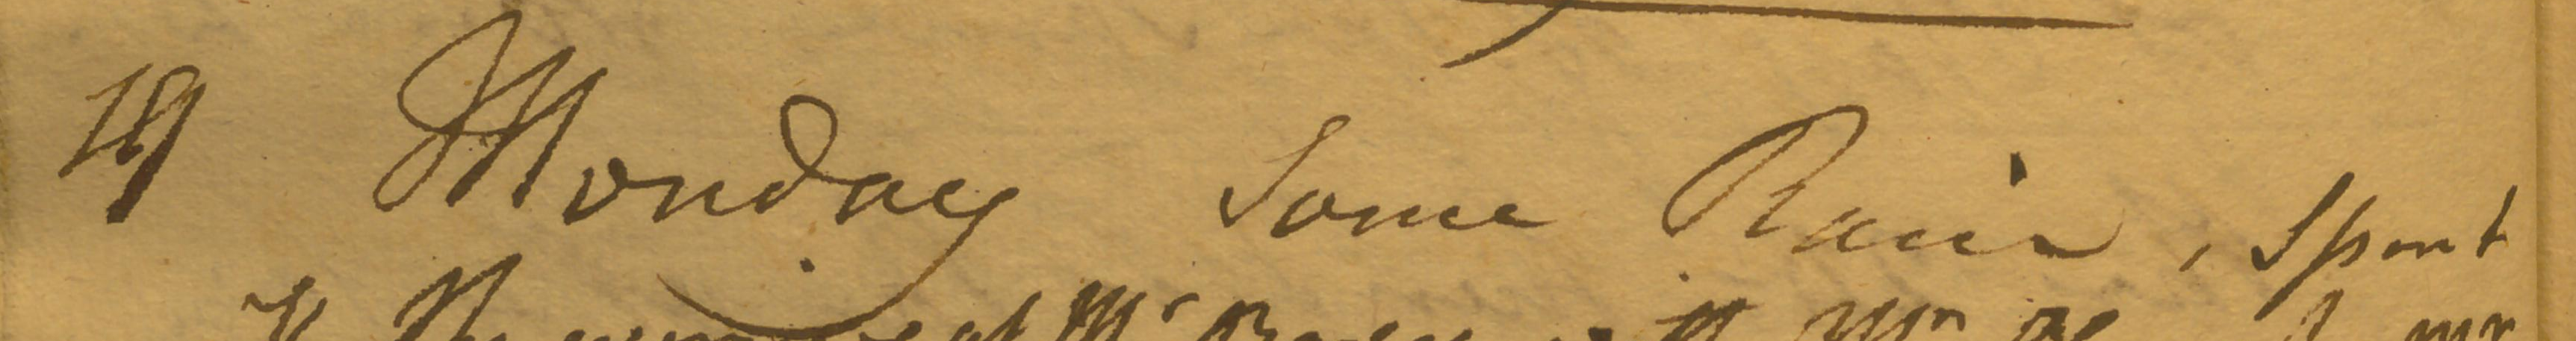19 Monday some Rain, spent
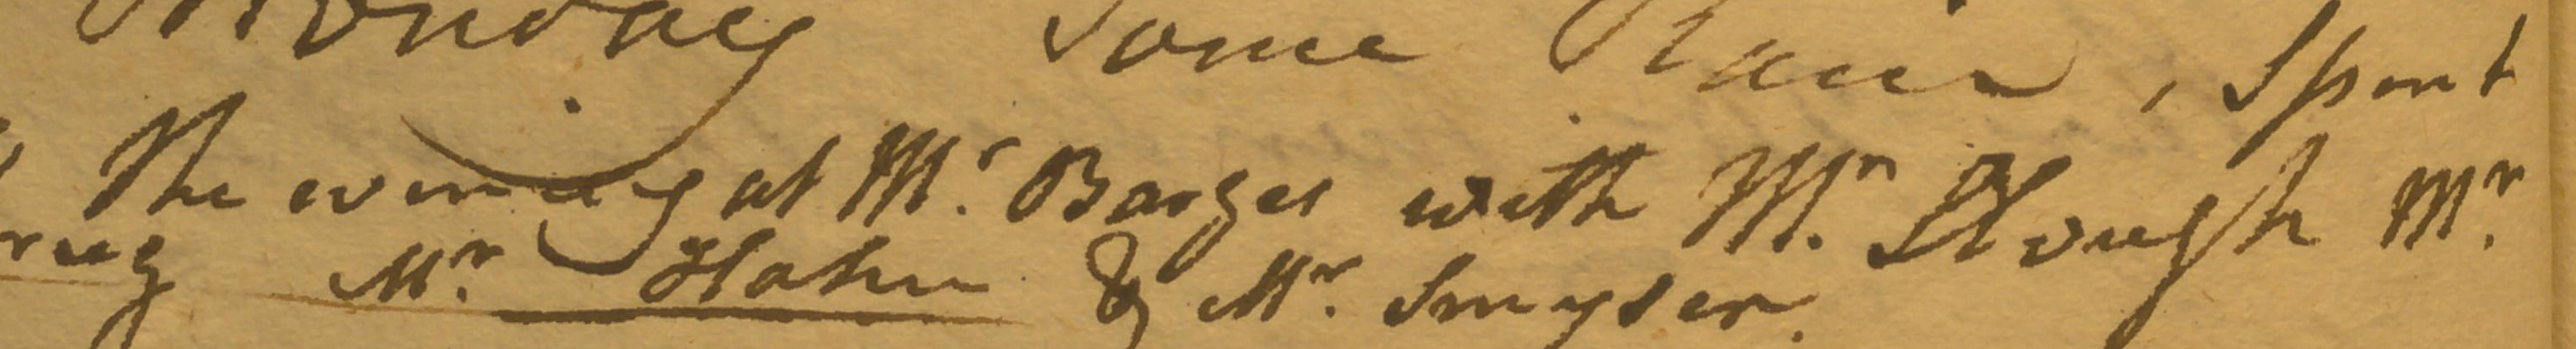the evening at M^r. Barges with M^r. Slough M^r.
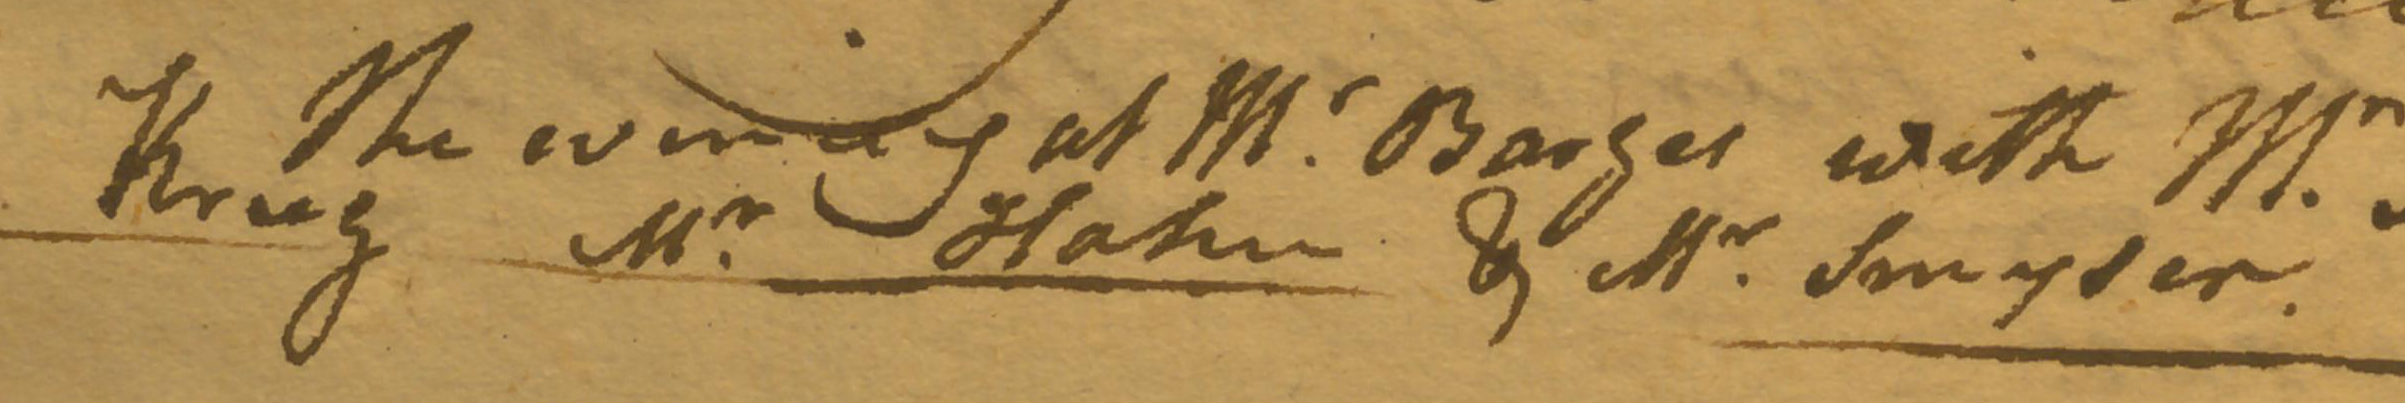Krug M^r. Hahn & M^r. Smyser
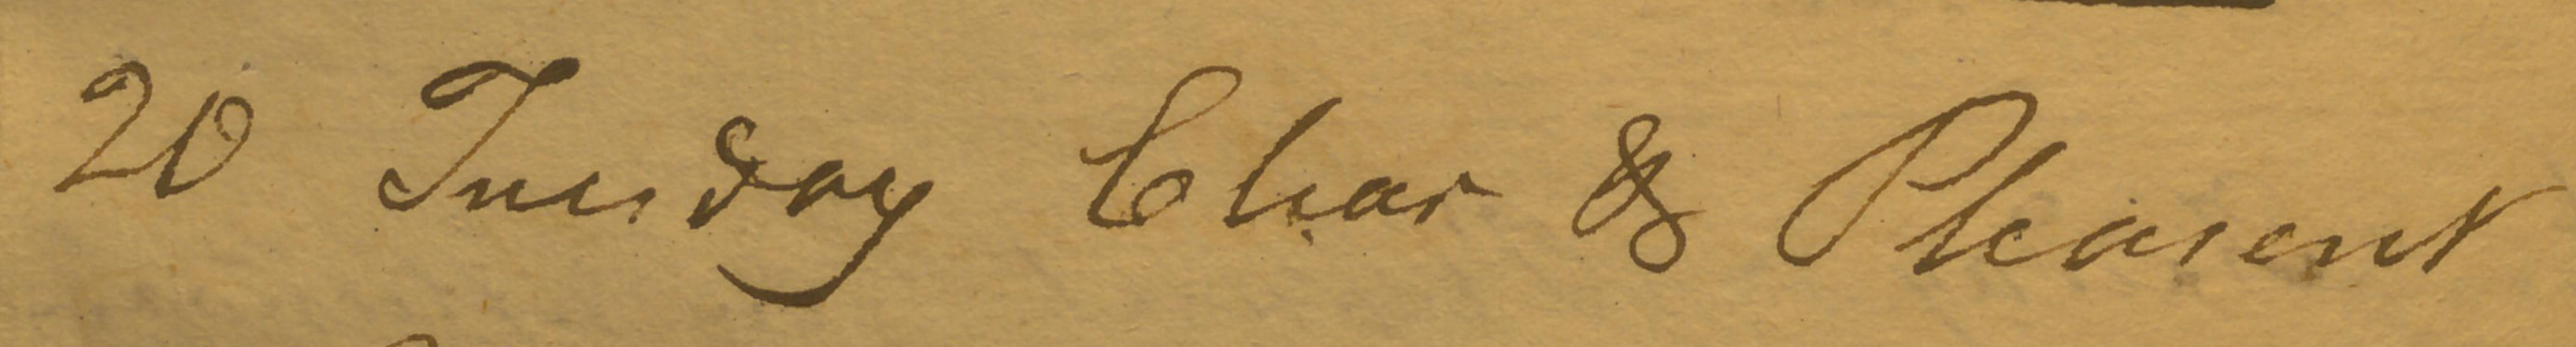20 Tuesday Clear & Pleasent
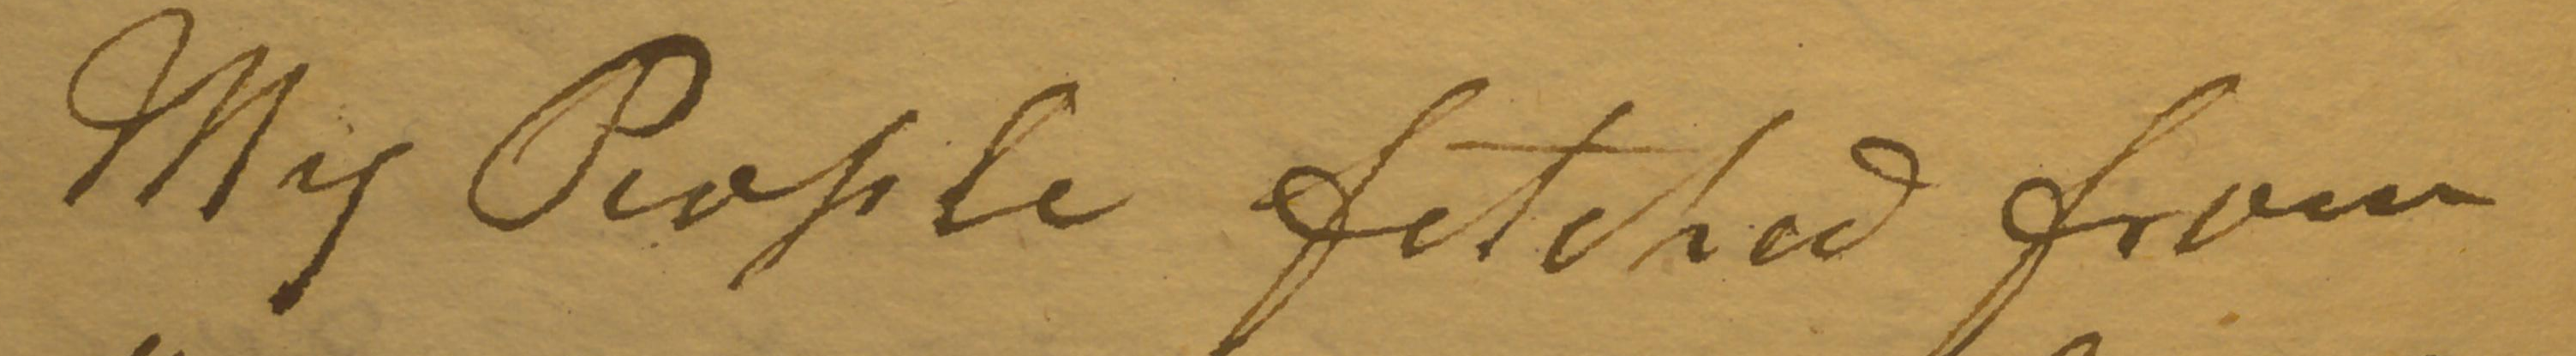My People fetched from
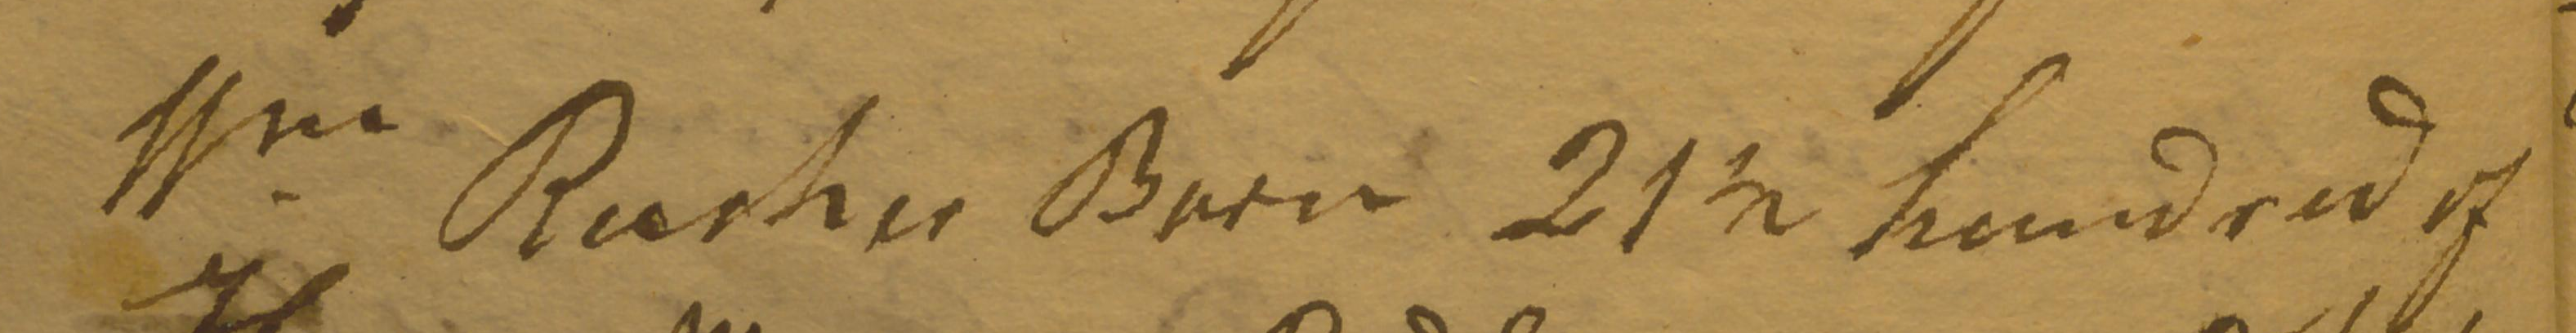W^m. Rushes Barn 21 1/2 hundred of
